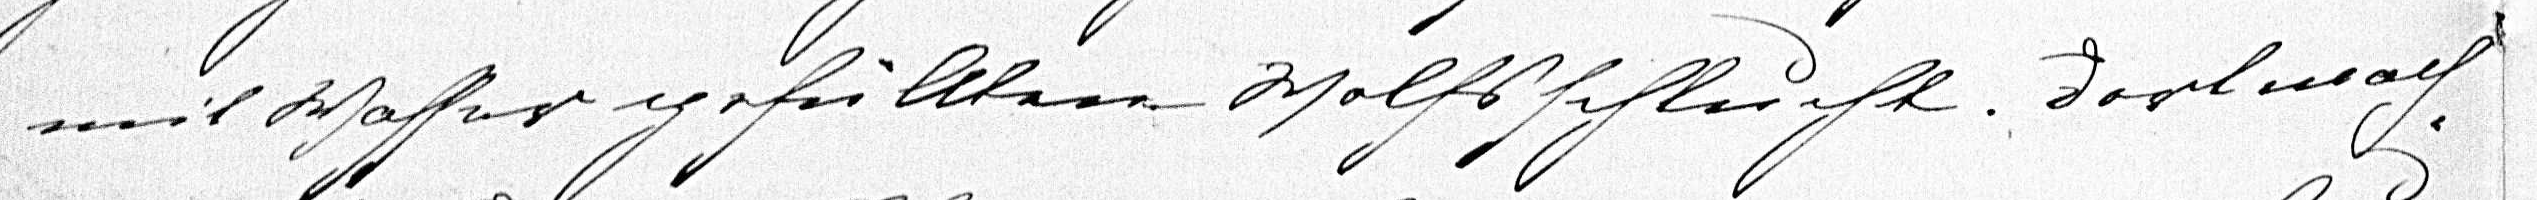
mit Wasser gefüllten Wolfsschucht. Dortmach¬
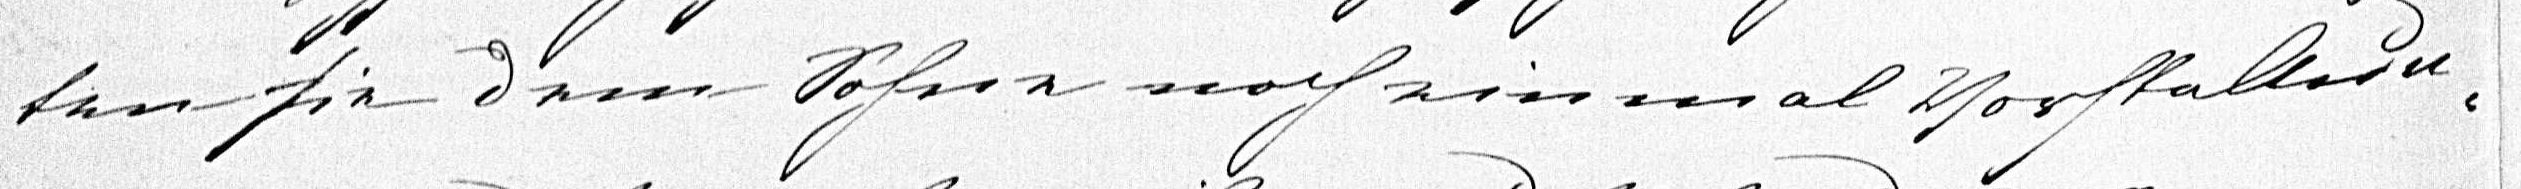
ten sie dem Sohne noch ein mal Vorstallun¬
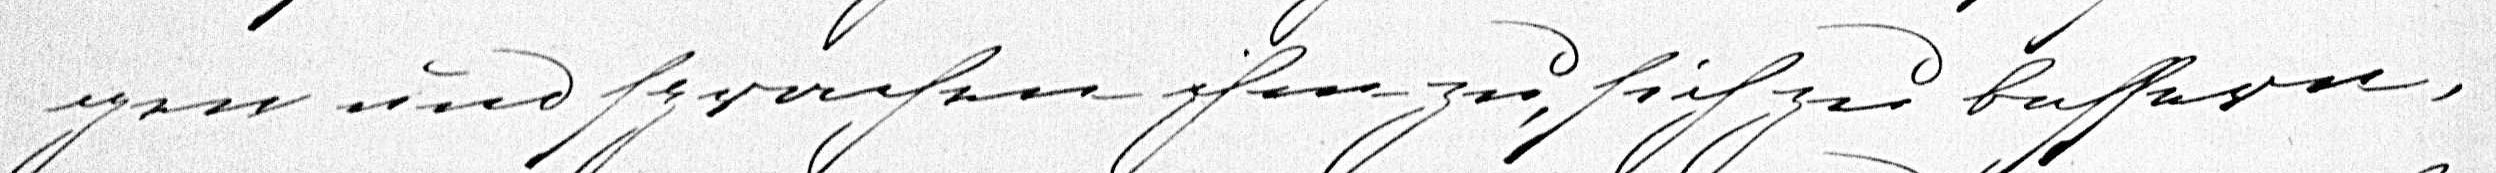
gen und szrachen ihm zu, sich zu bassern,
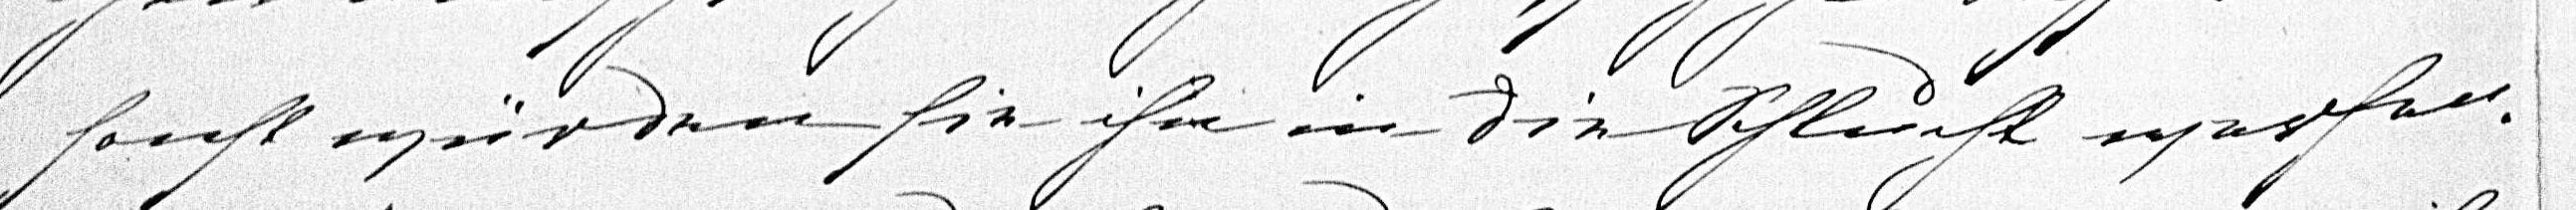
sonst würden sie ihn in die Schucht werfen.
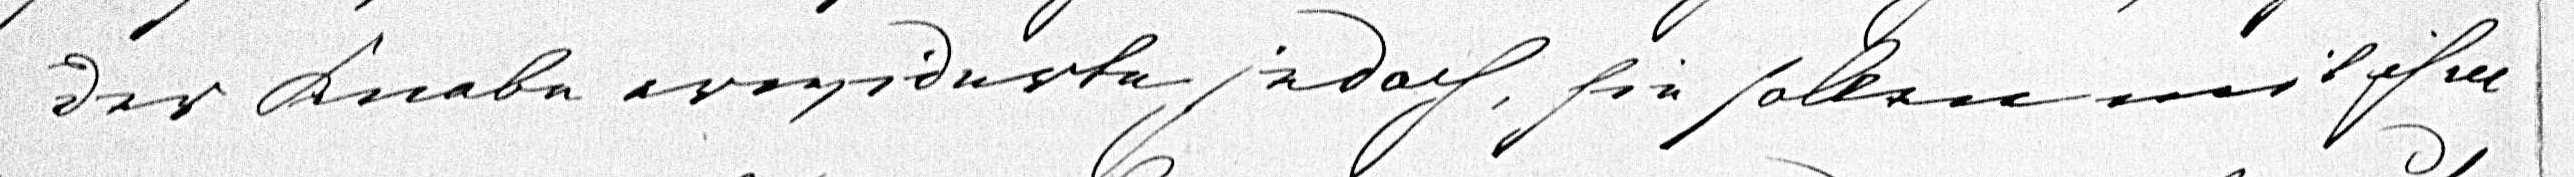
Der Knabe ereviderte jedoch, sie sollten mit ihm
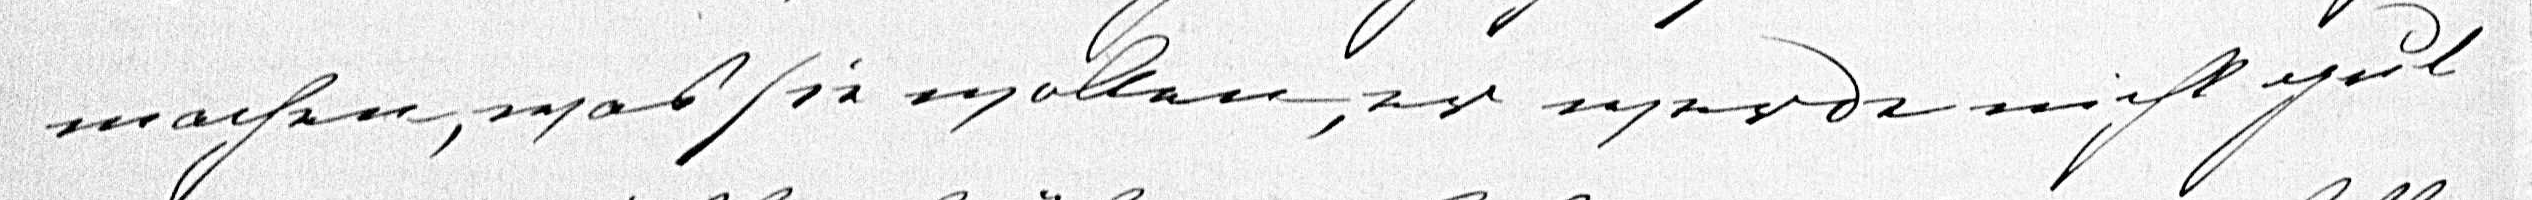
machen, was sie wollen, er werde nicht gut
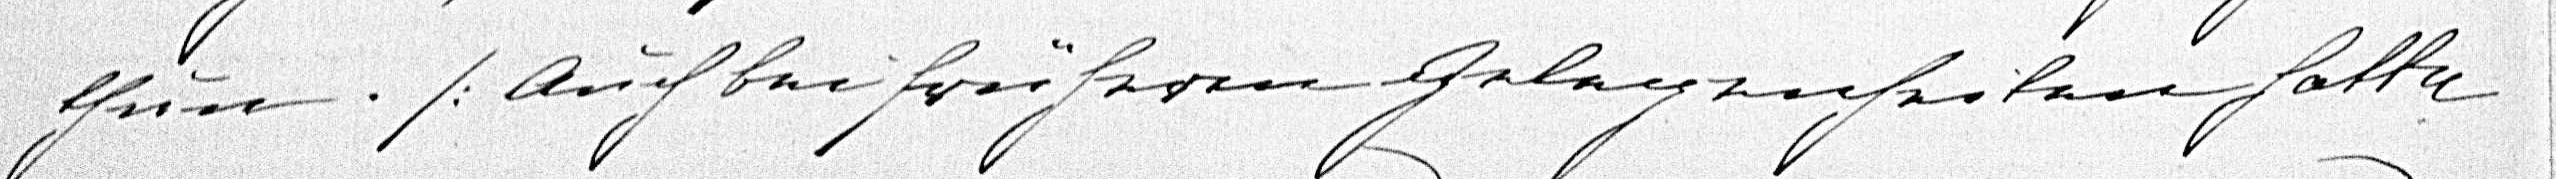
thun./: Auch bei früheren Gelegenheiten hatte
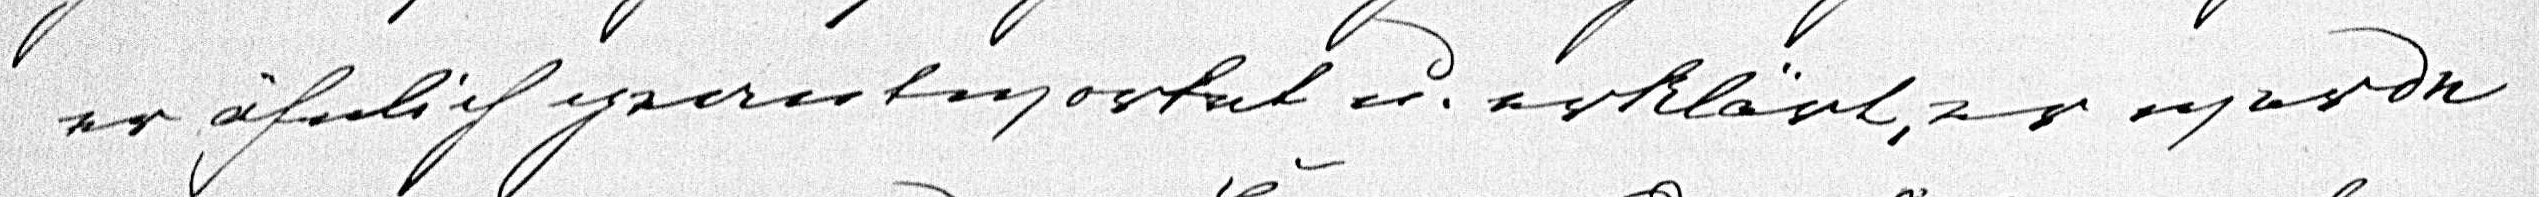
er ähnlich geantwortet u. erklärt, er werde
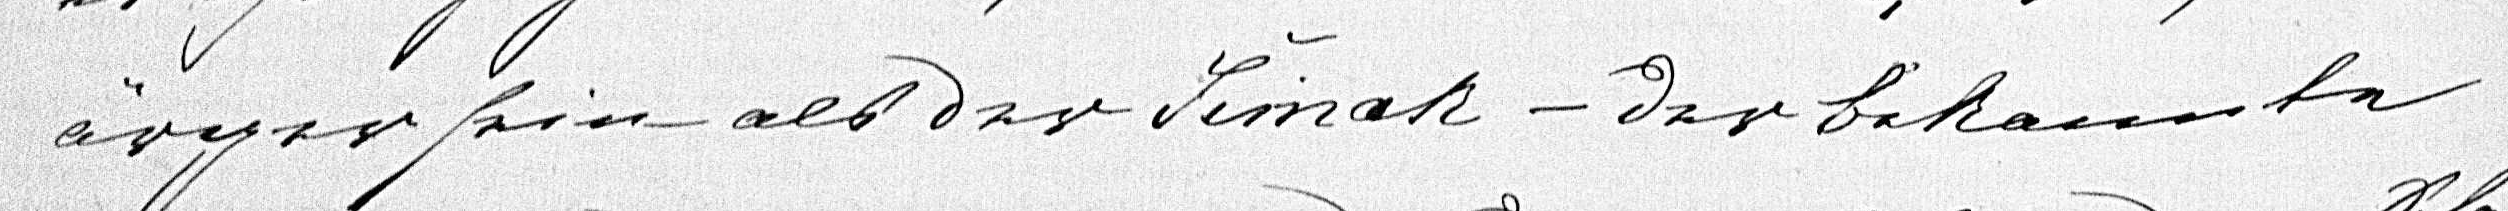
ärger sein als der Simak – Der bekannte
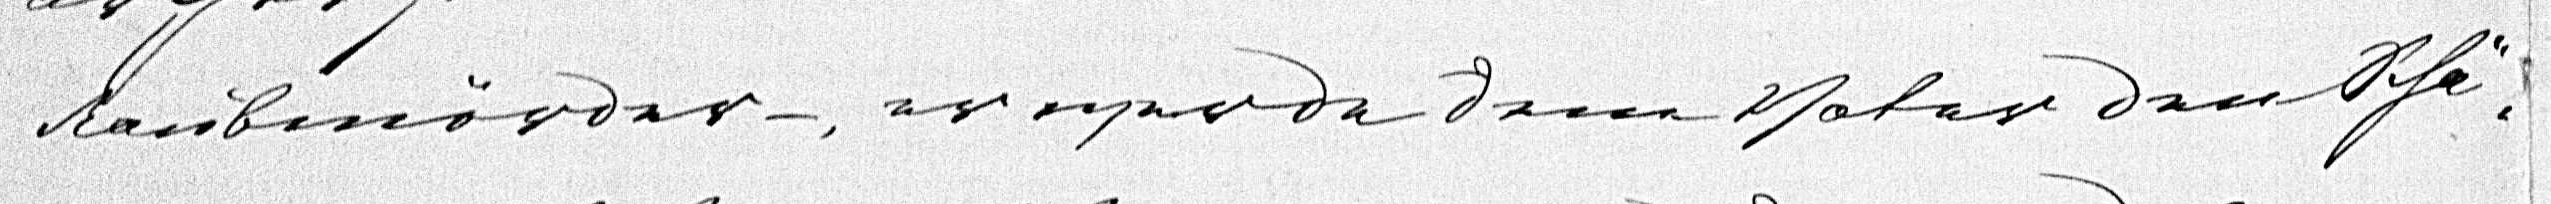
Raubmörder -, er werde dem Vater den Schä¬
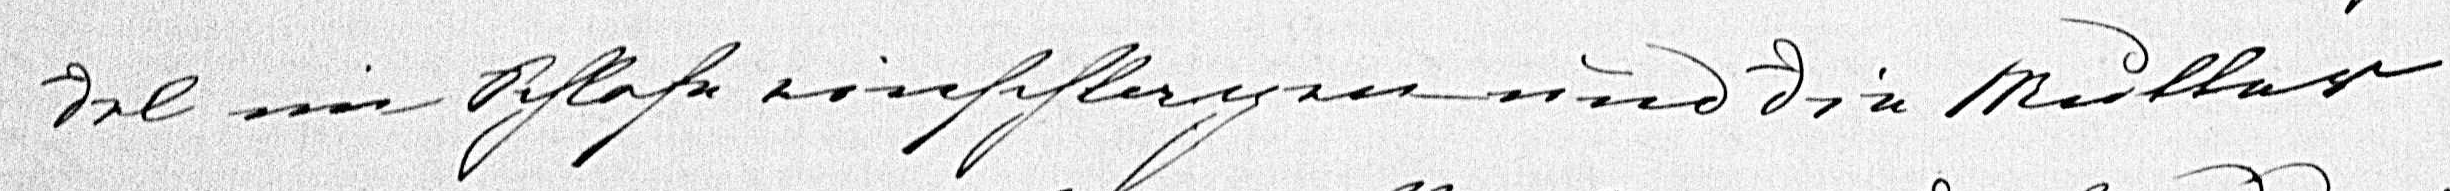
del im Schlafe einschlagen und die Mutter
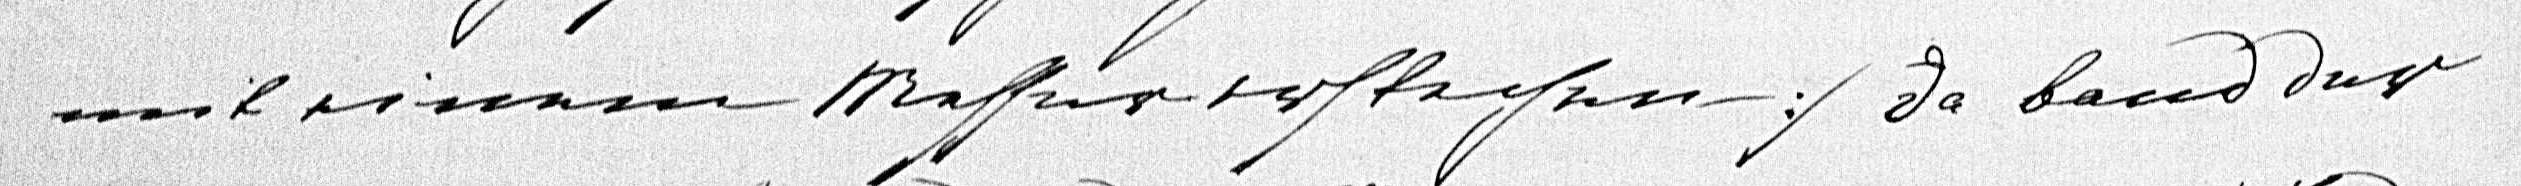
mit einem Messererstechen :/ da band der
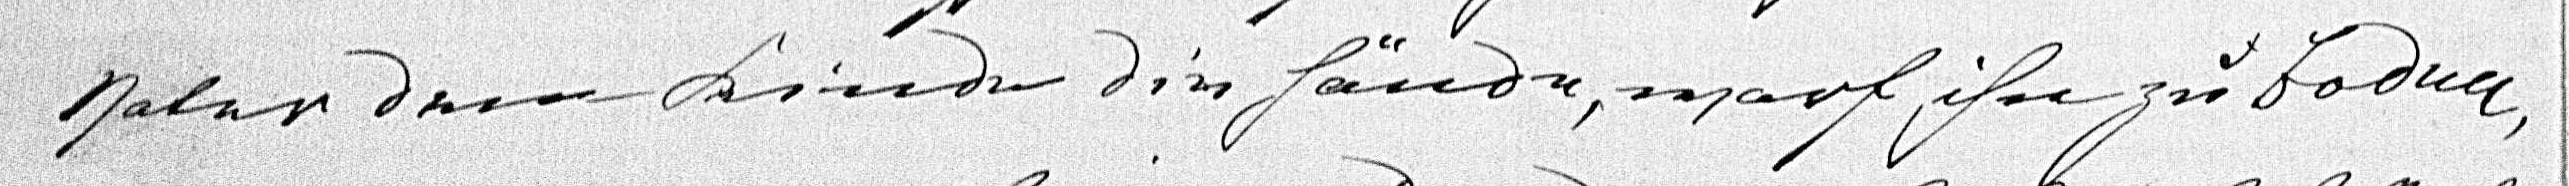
Vater dem Kinde die hände, warf ihn zu Boden,
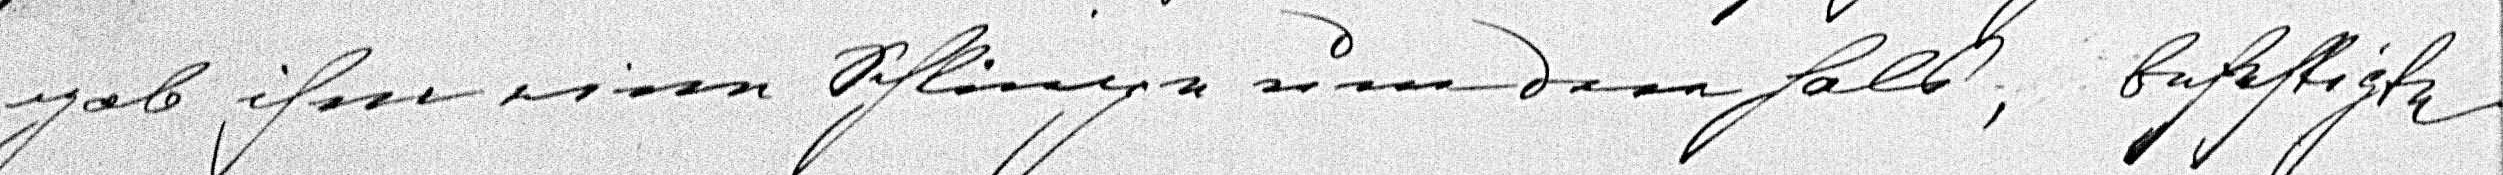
gab ihm eine Schlinge um dem Hals, befestigte
